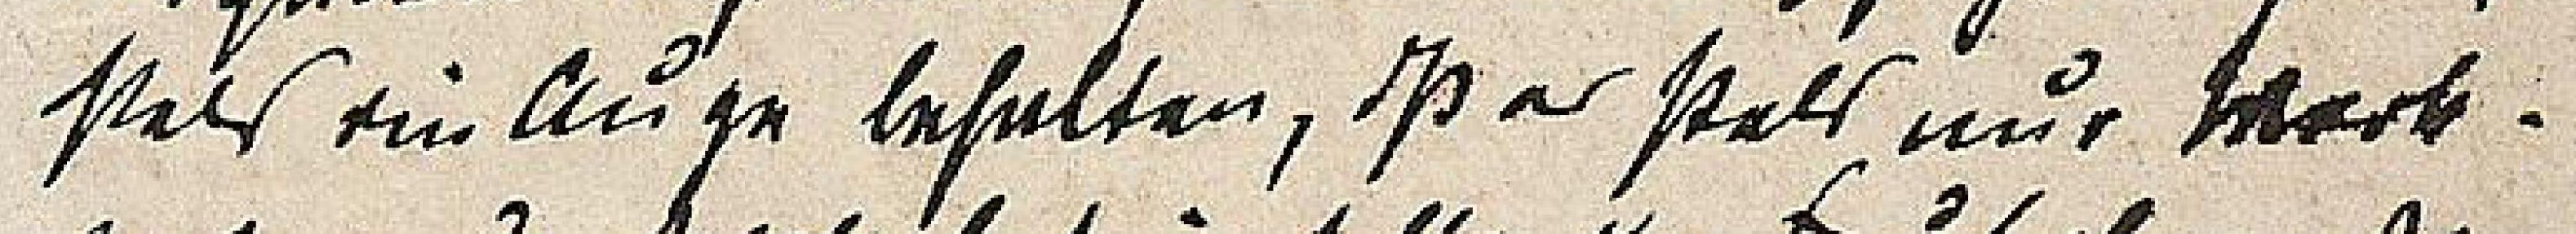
stets im Auge behalten, daß er stets nur Werk¬:
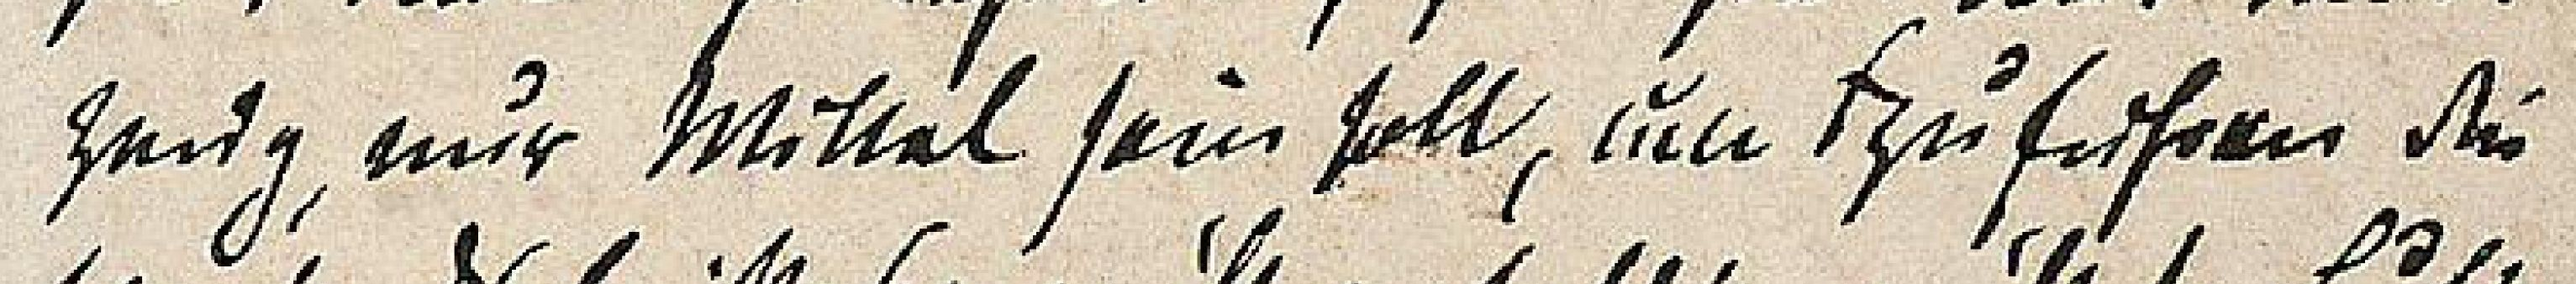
zeug, nur Mittel sein soll, um szuführen die
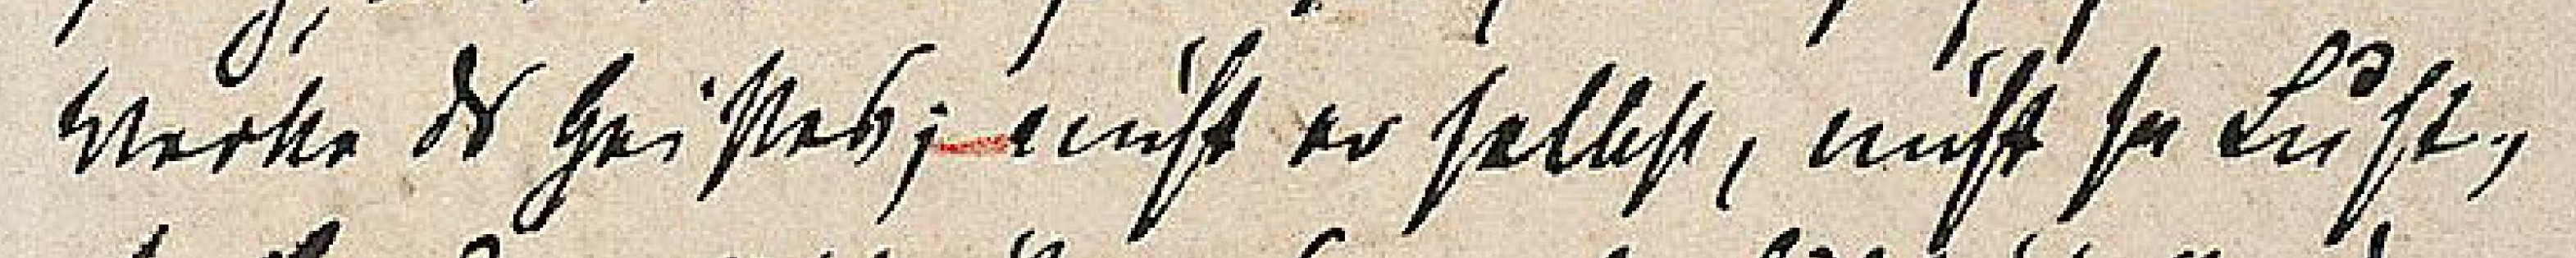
Werke des Geistes; nicht er selbst, nicht sn Lust,
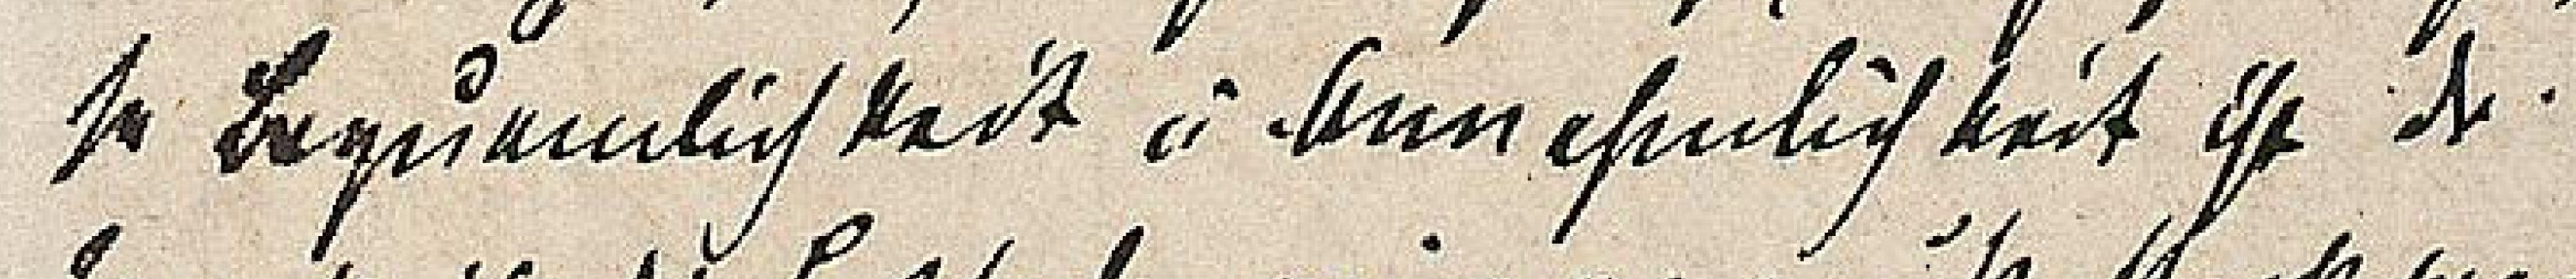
sn Bequemlichkeit u Annehmlichkeit ist dr.
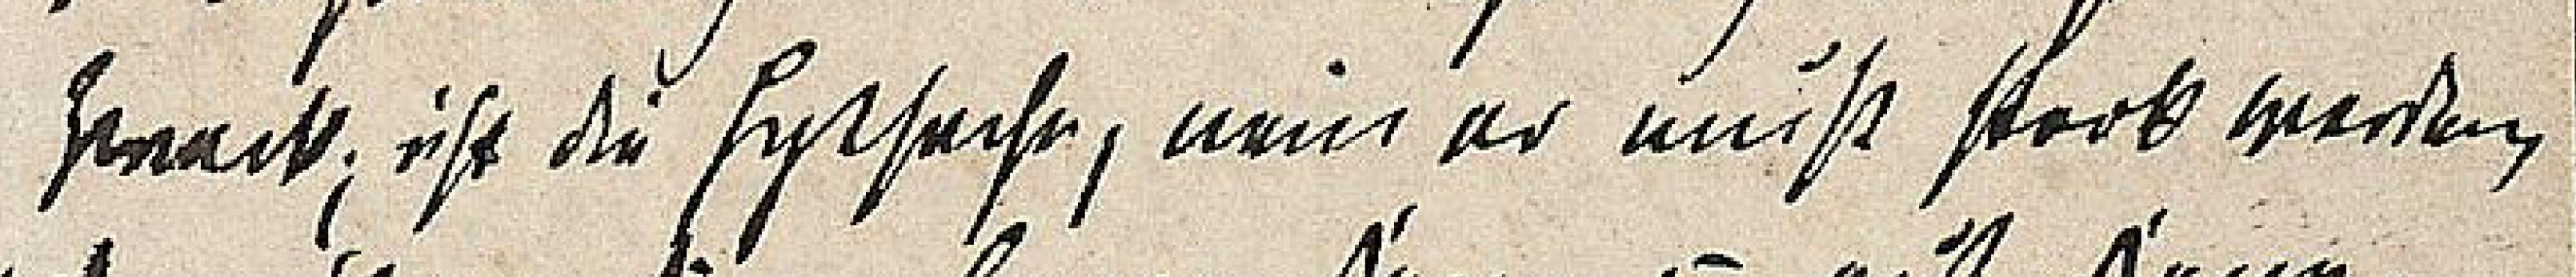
Zweck, ist die Hptsache, nein er mußt stark werden,
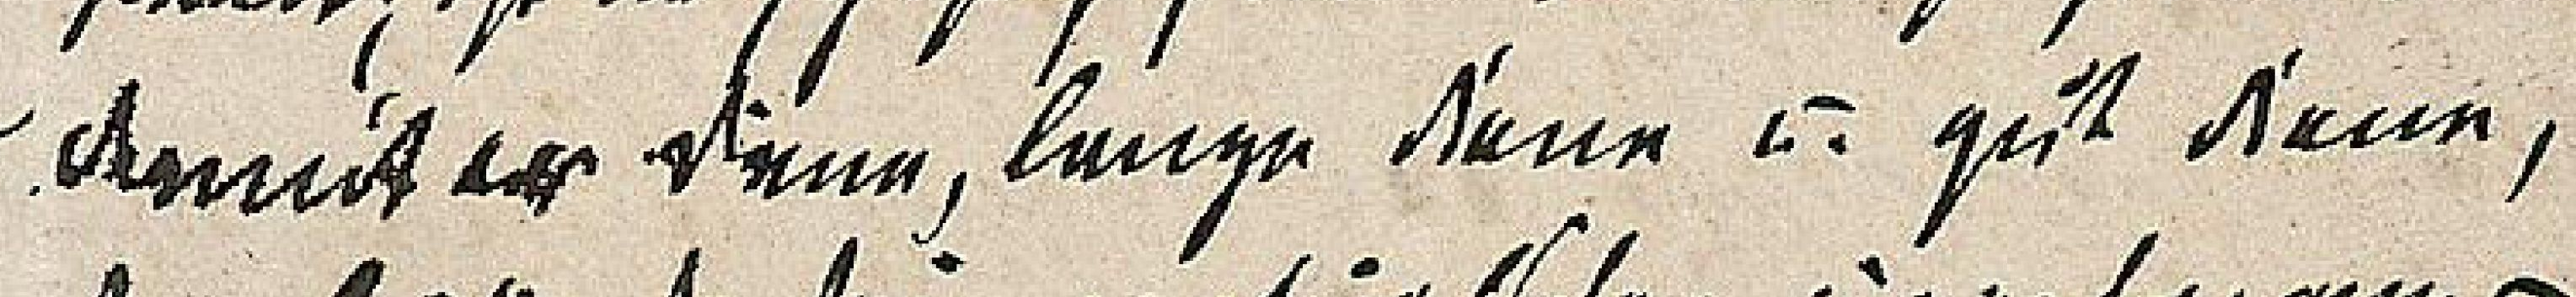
damit er diene, lange diene u. gut diene,
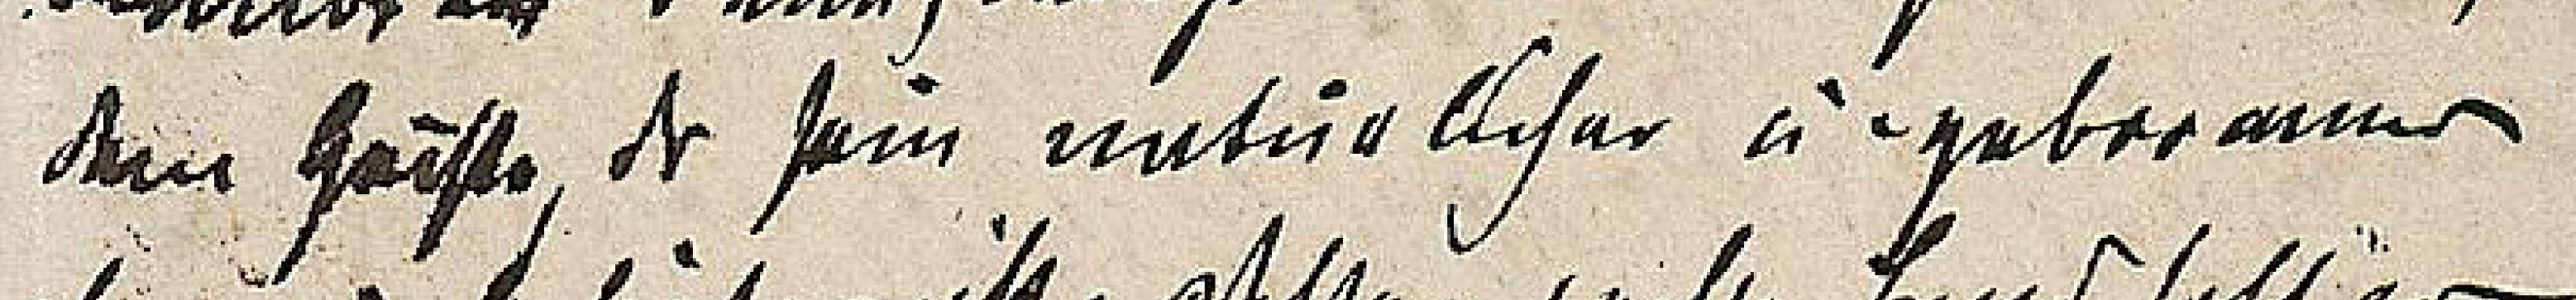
dem Geiste, dr sein natürlicher u geborener
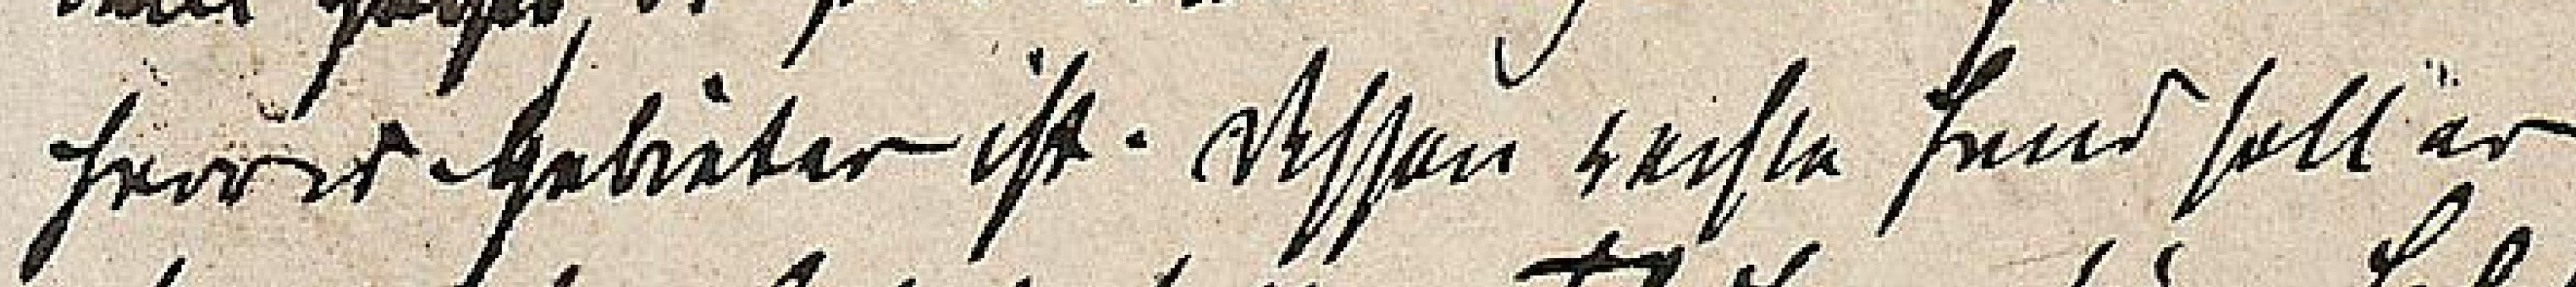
Herr u Gebieter ist. Dessen rechte Hand soll er
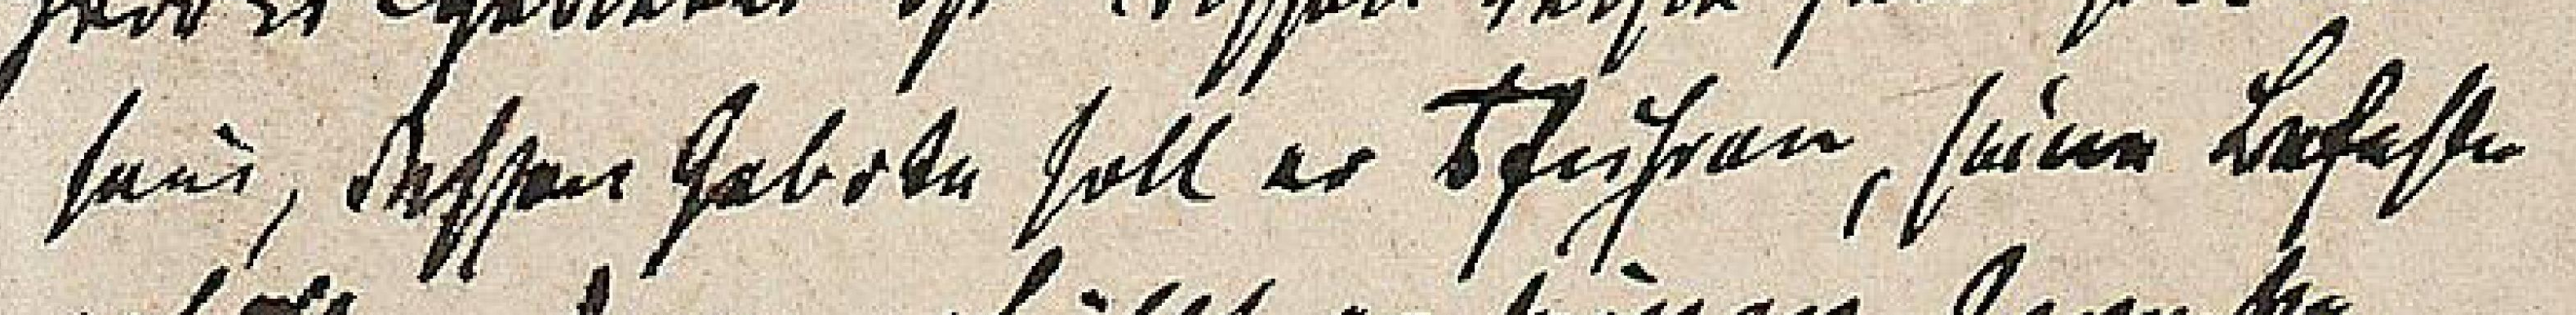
sein, dessen Gebote soll er sführen, seine Befehle
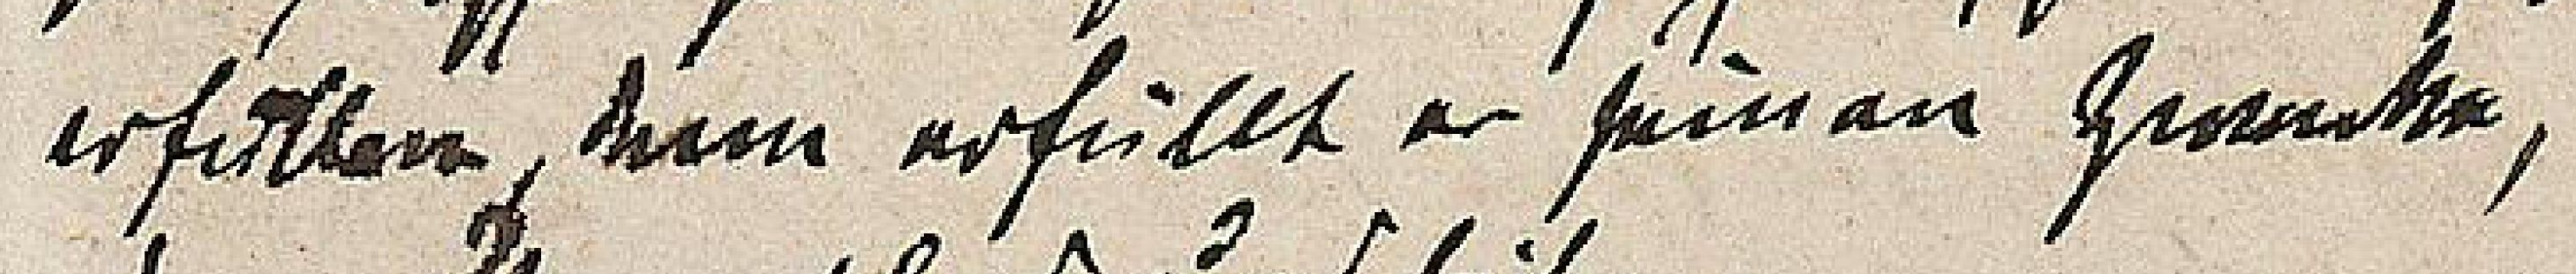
erfüllen, dann erfüllt er seinen Zwecke,
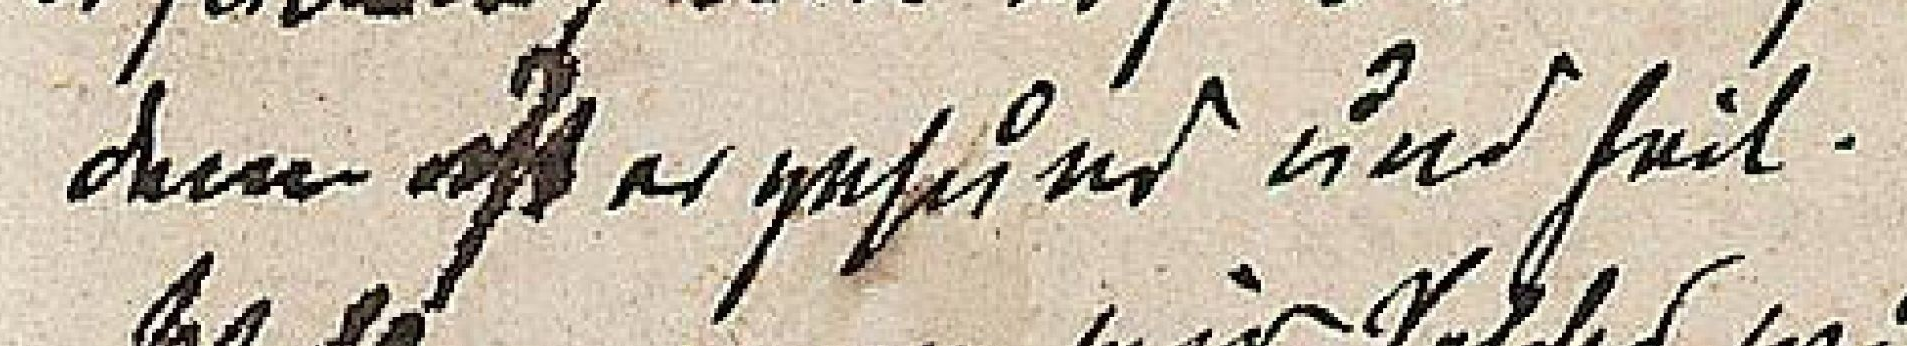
dann ist er gesund und heil.
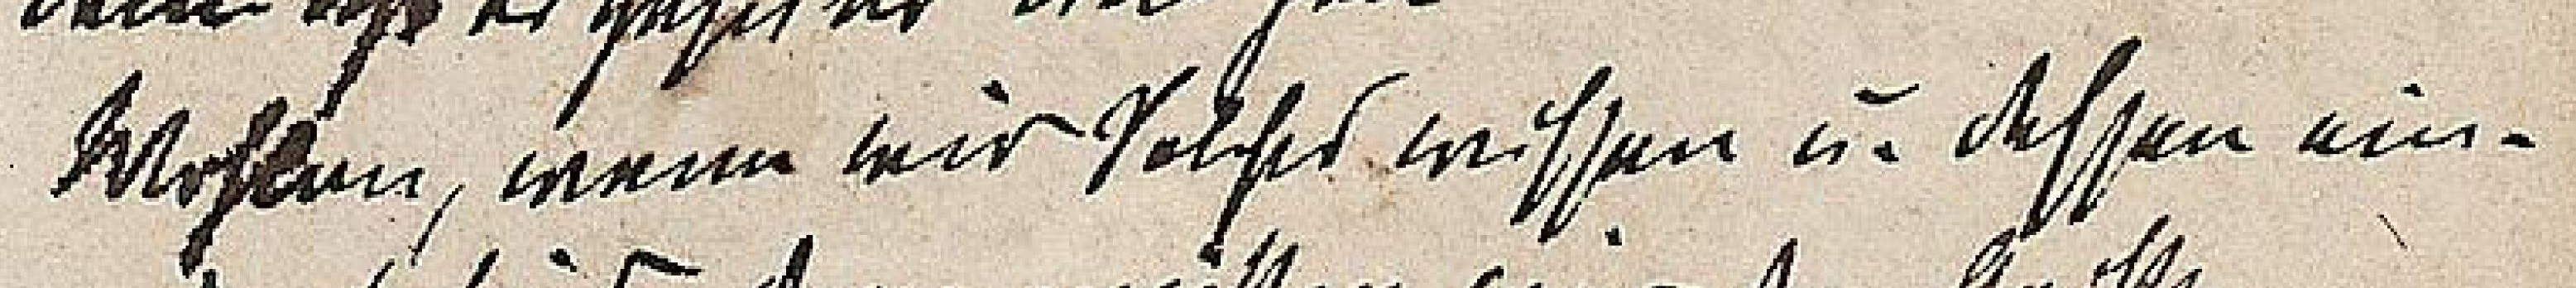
Wohlann, wenn wir solches wissen u. dessen ein¬
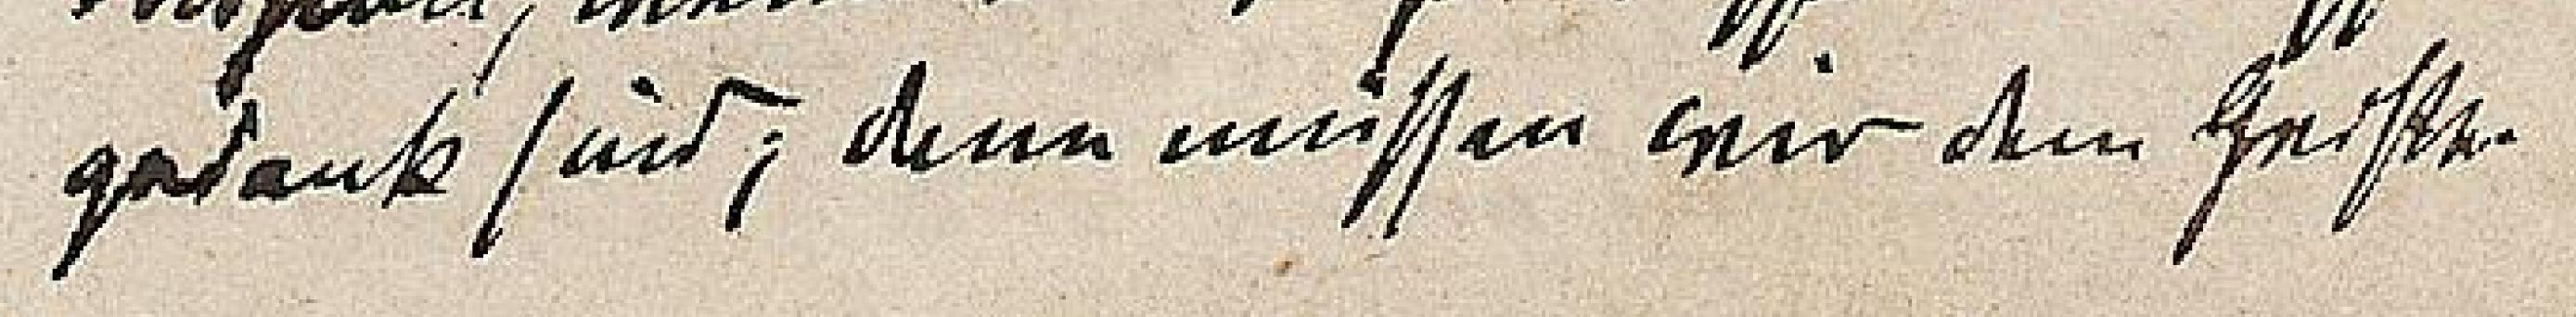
gedenkt sind; dann müssen wir dem Geiste
